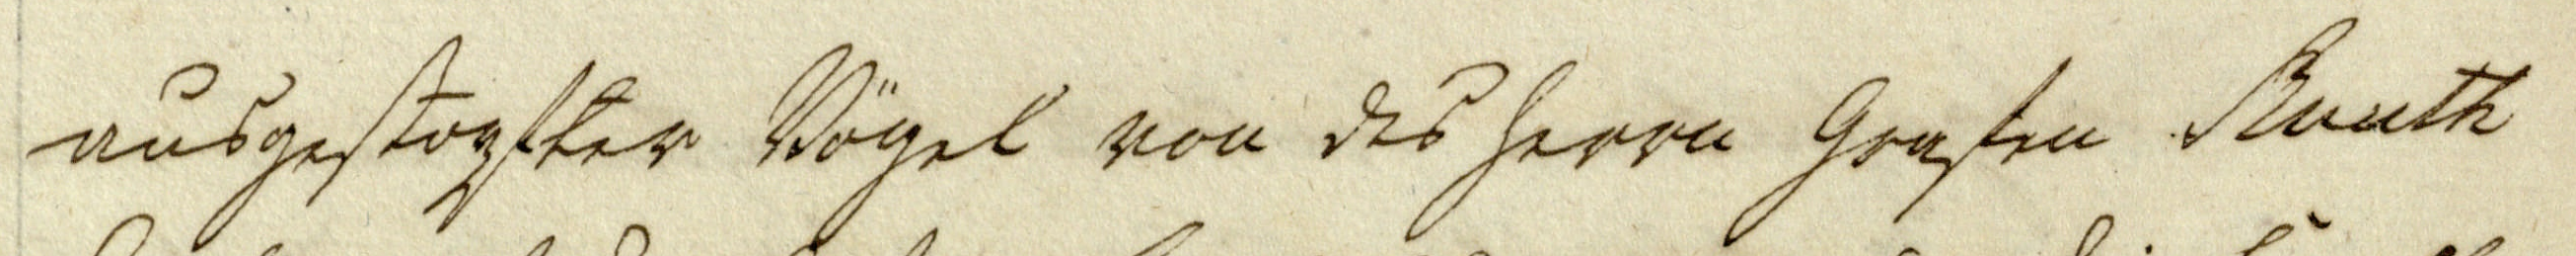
ausgestopfter Vögel von des herrn Grafen Ruuth
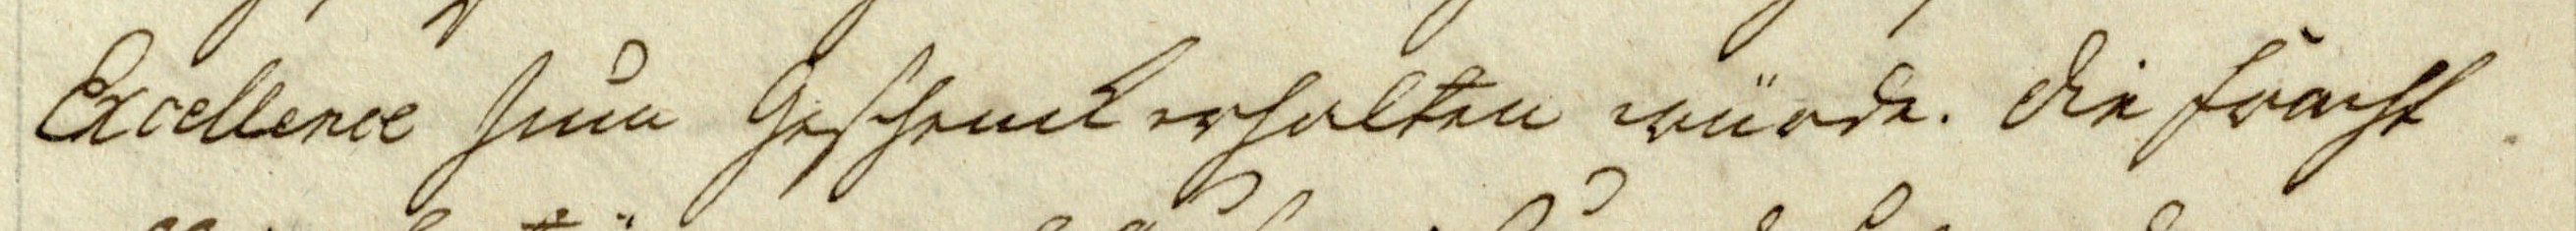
Excellence zum Geschenck erhalten würde. Die Fracht
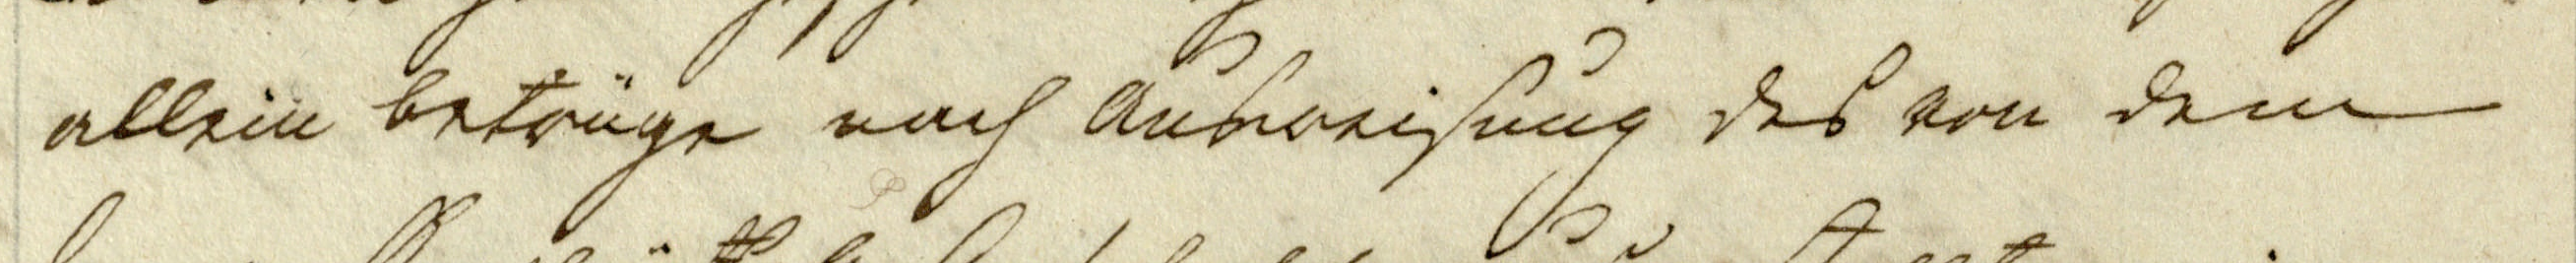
allein betrüge nach Ausweisung des von dem
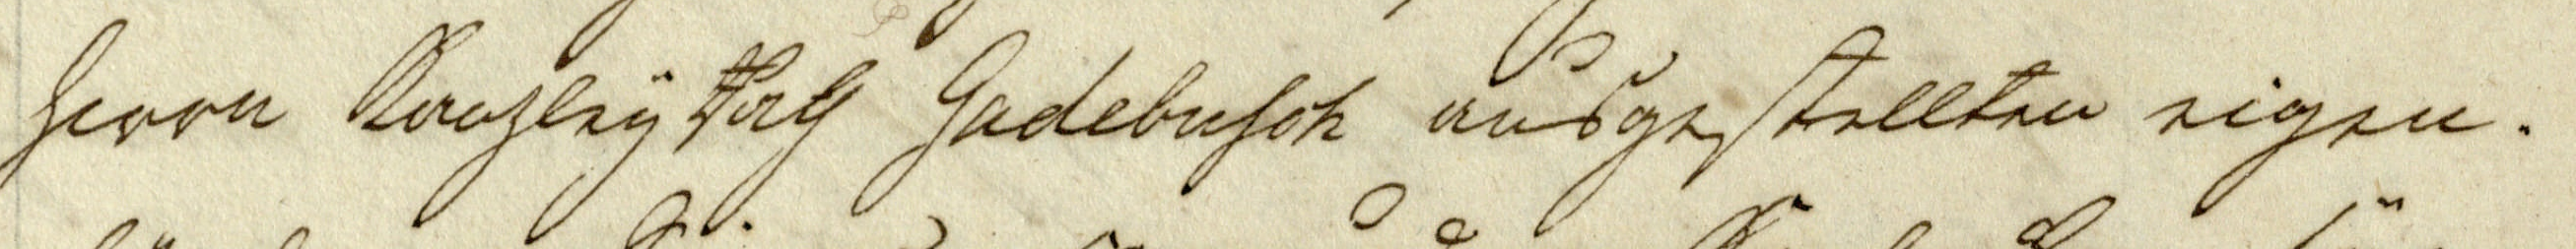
herrn Kanzleÿ Rath Gadebusch ausgestellten eigen¬
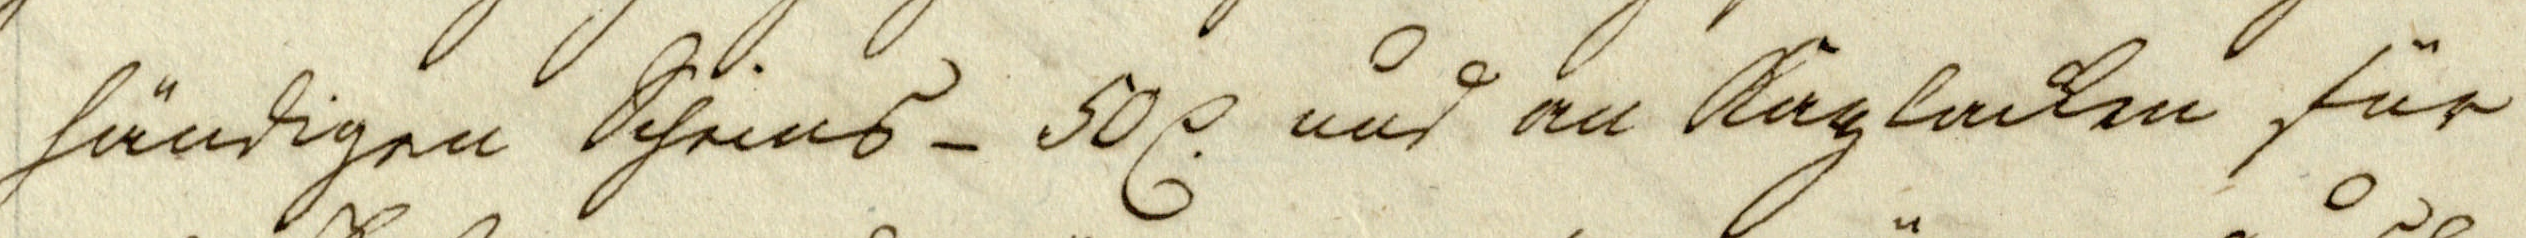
händigen Scheins 50 l. und an Kaplacken für
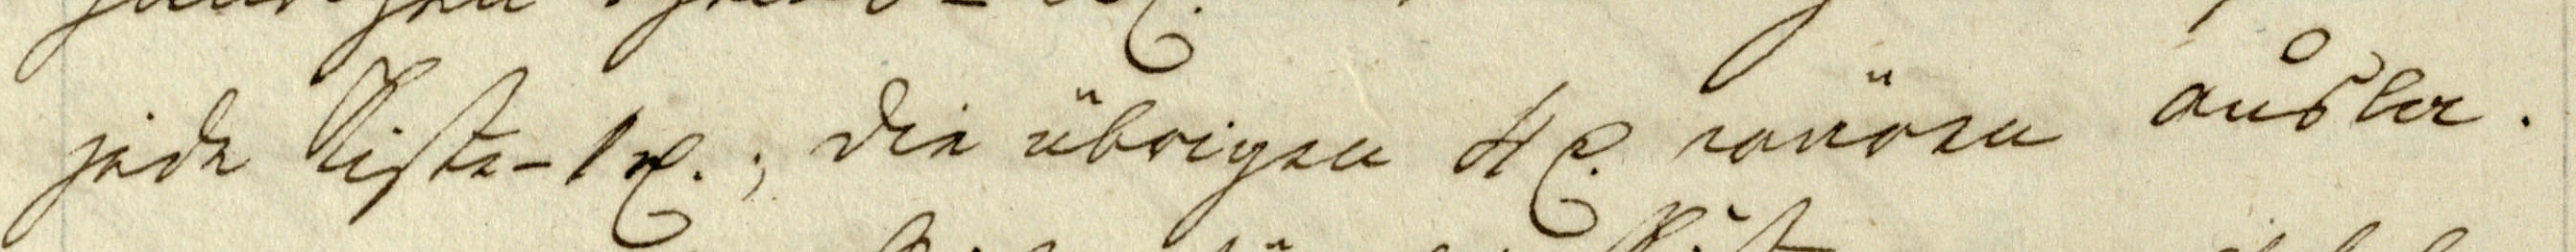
jede Kiste 1 l., die übrigen 4 l. wären Ausla¬
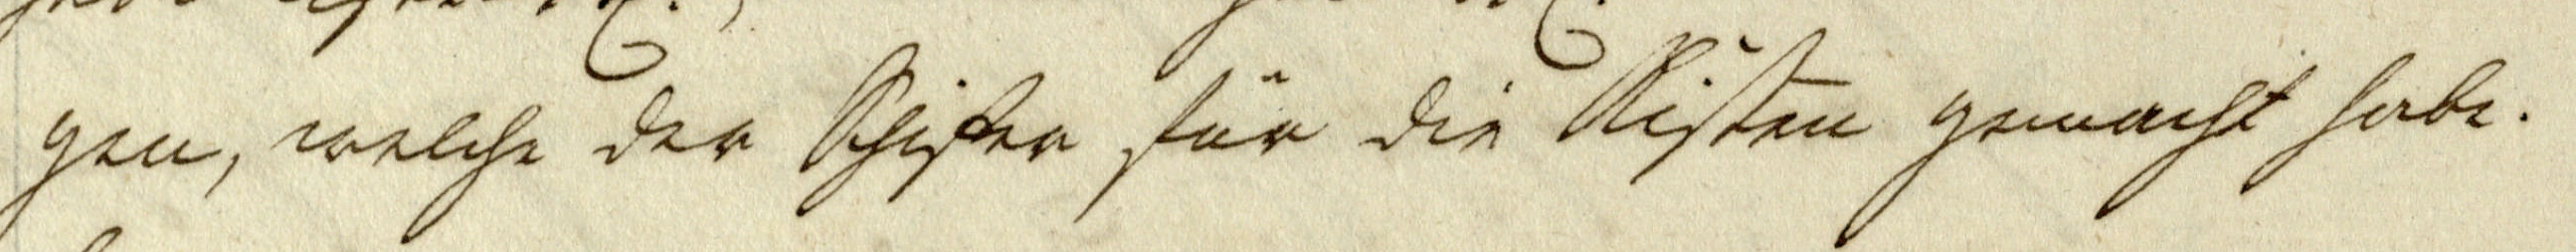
gen, welche der Schifer für die Kisten gemacht habe.
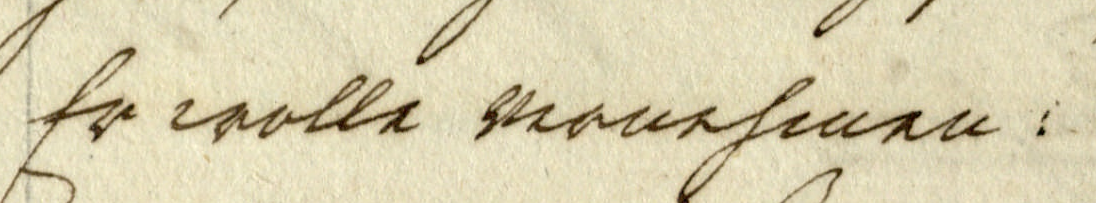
Er wolle vernehmen:
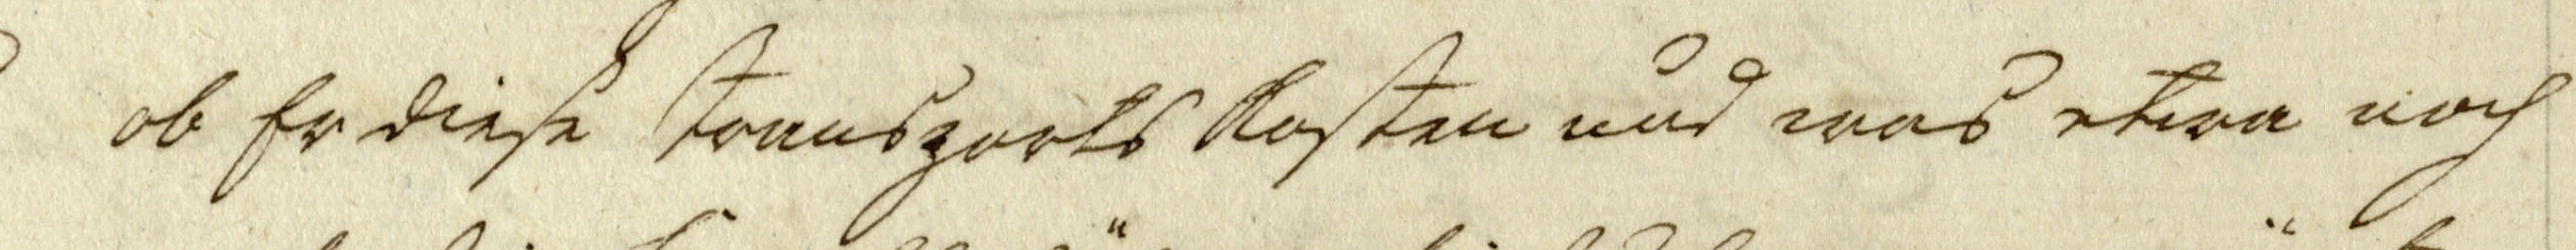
ob Er diese Transports Kosten und was etwa noch
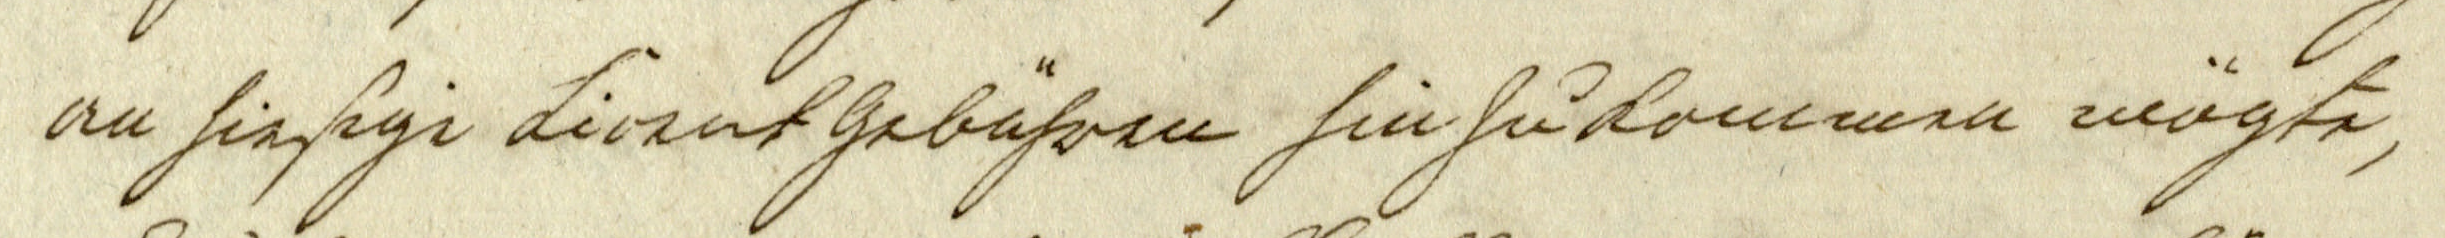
an hiesige Licent Gebühren hinzukommen mögte,
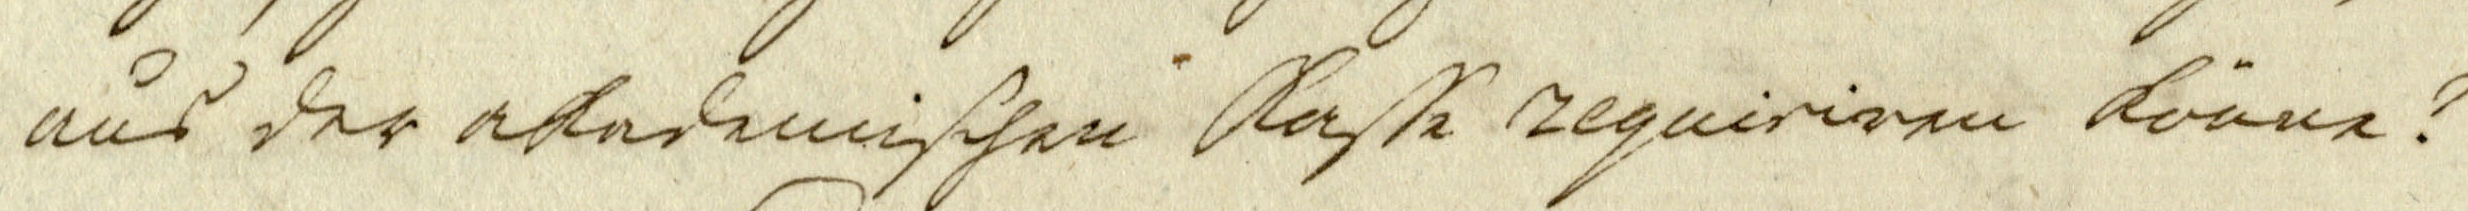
aus der akademischen Kasse requiriren könne!
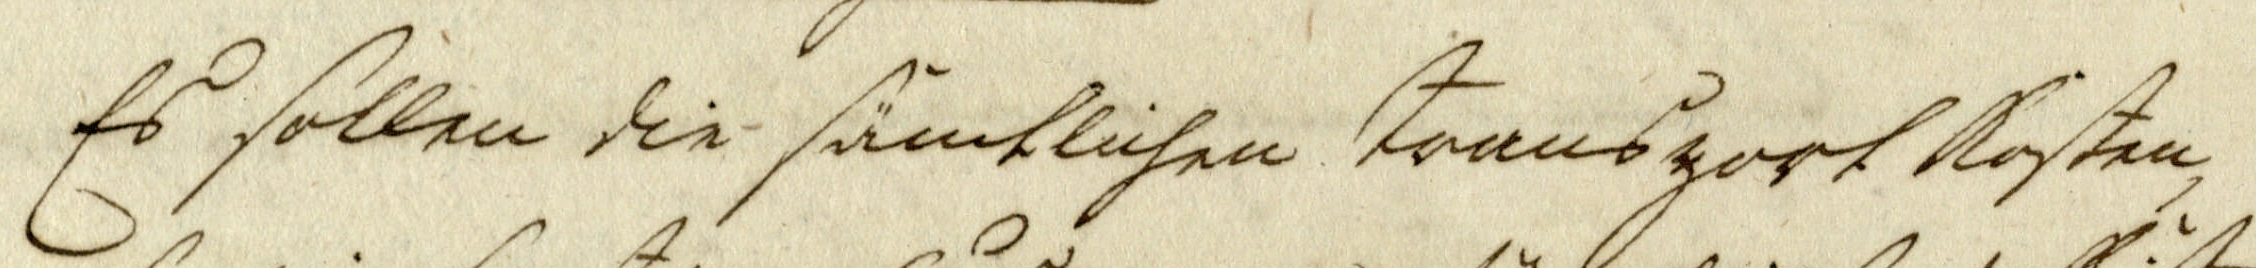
Es sollen die sämtlichen Transport Kosten
